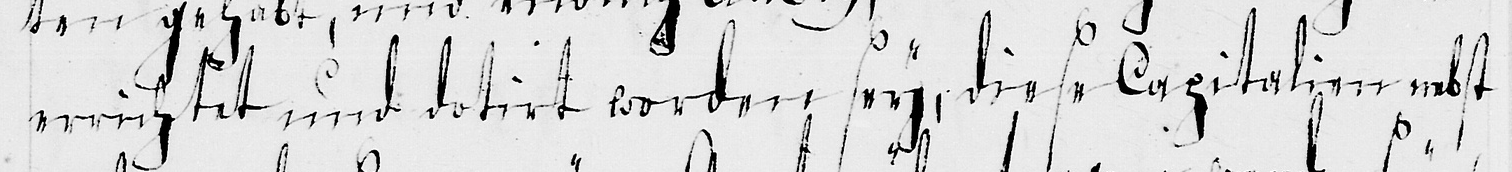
errichtet und dotirt worden sey, diese Capitalien nebst
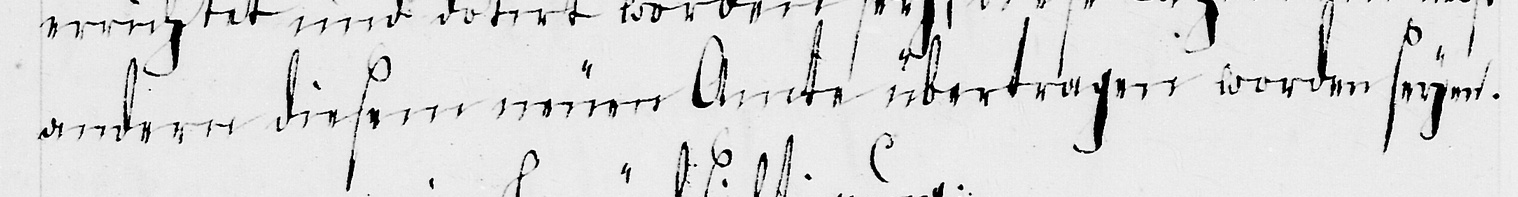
andern diesem neuen Amte übertragen worden seyen.
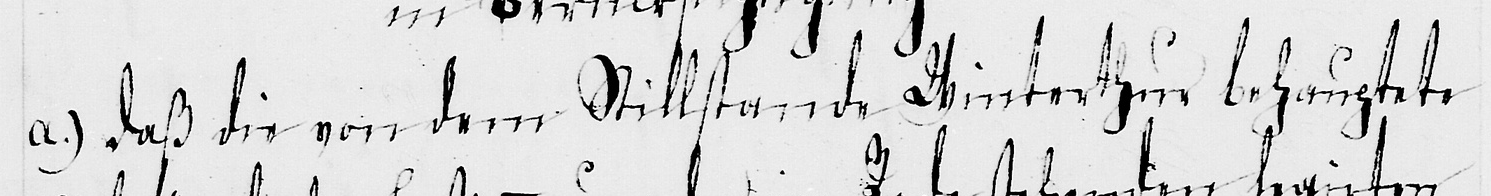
a.) daß die von dem Stillstande Winterthur behauptete
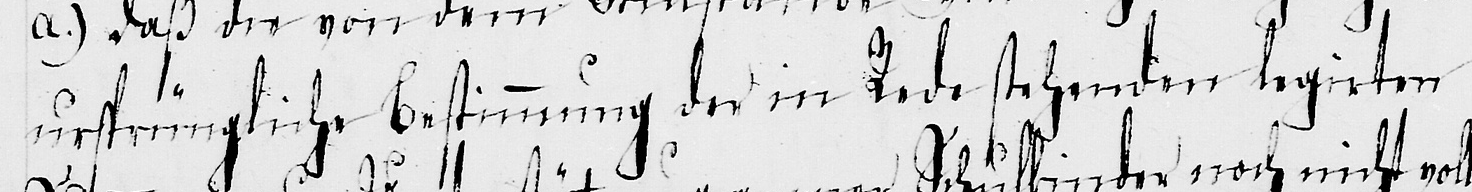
ursprüngliche Bestimmung der in Rede stehenden legirten
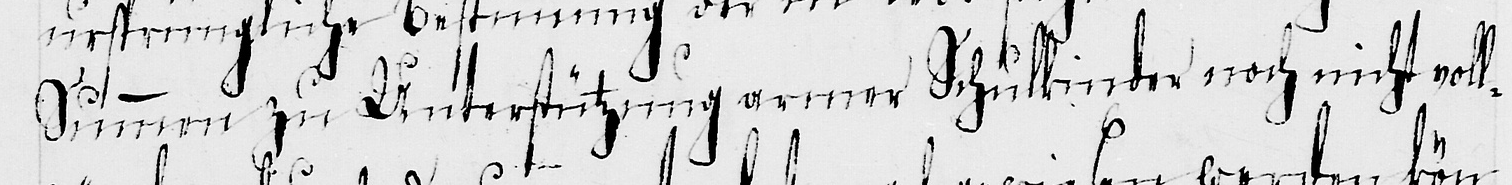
Summen zu Unterstützung armer Schulkinder noch nicht vol¬
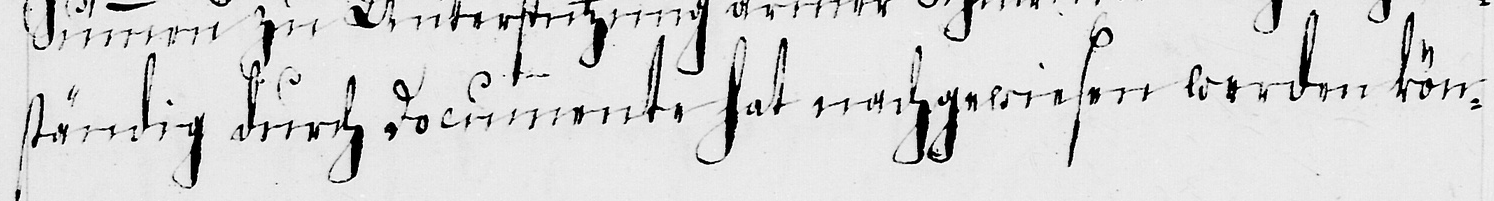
ständig durch Documente hat nachgewiesen werden kön¬
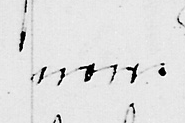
nen.
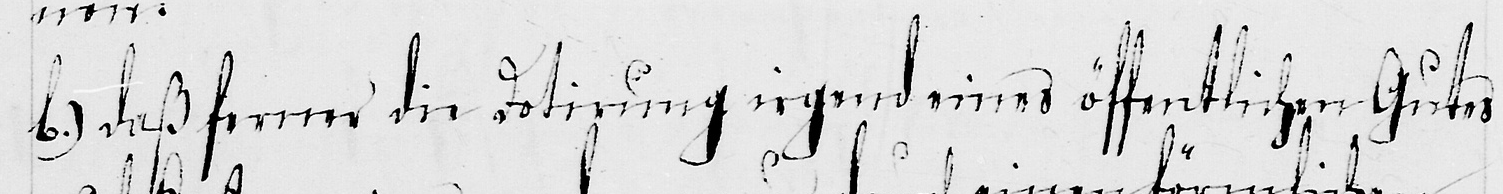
b.) daß ferner die Dotirung irgend eines öffentlichen Gutes
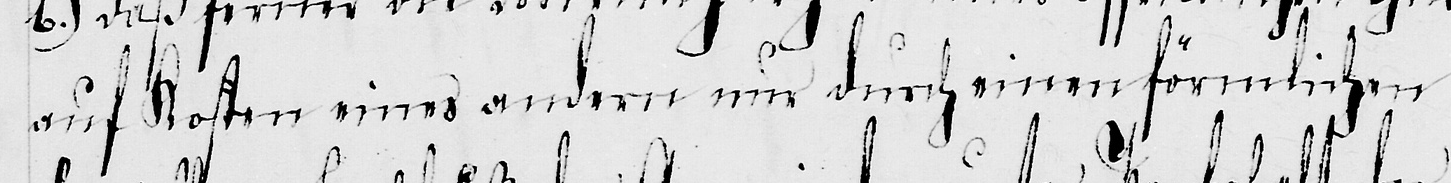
auf Kosten eines andern nur durch einen förmlichen
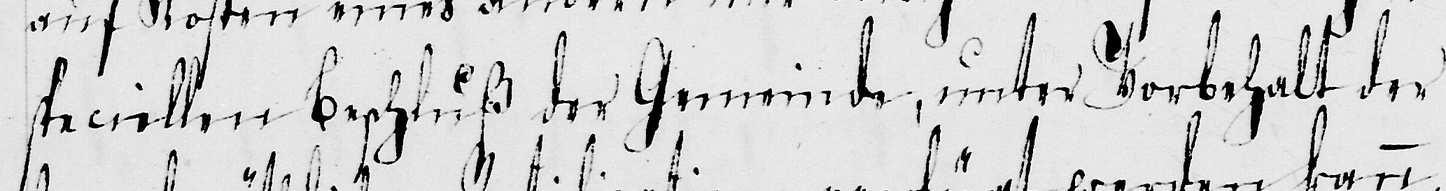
speciellen Beschluß der Gemeinde, unter Vorbehalt der
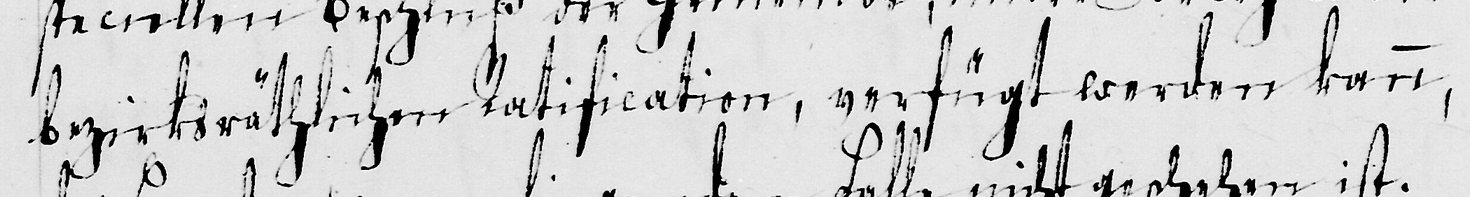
bezirksräthlichen Ratification, verfügt werden kann,
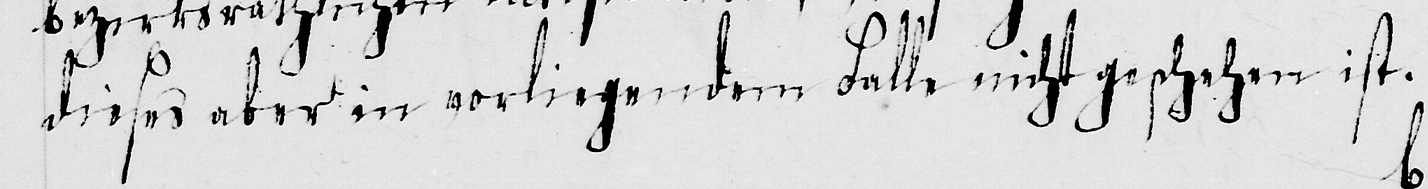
dieses aber in vorliegendem Falle nicht geschehen ist.
